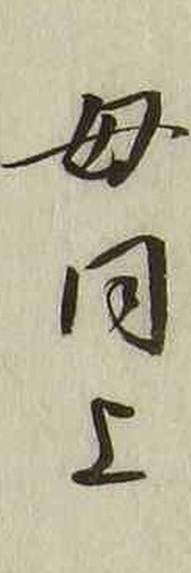母同上
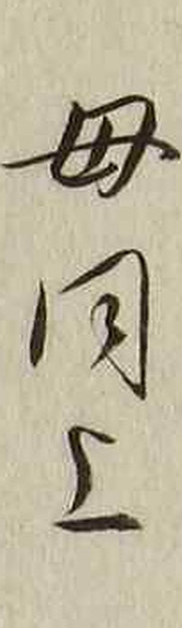母同上
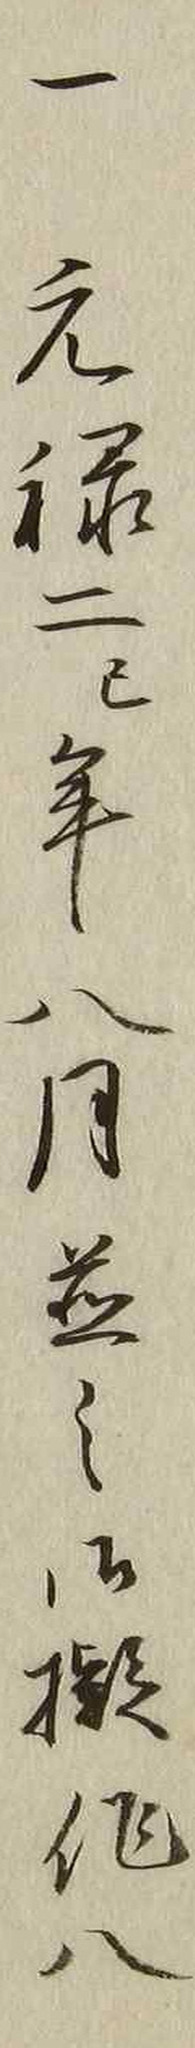一元禄二巳年八月並之御擬作八
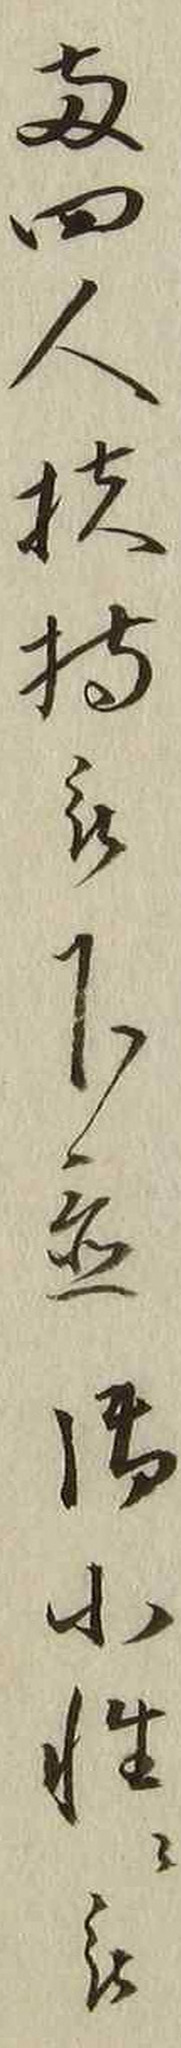両四人扶持被下置御小性ニ被
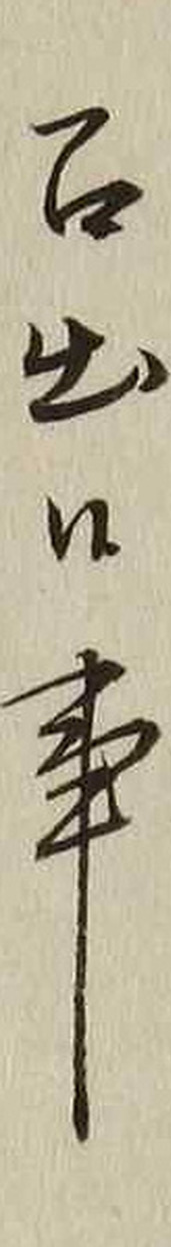召出候事
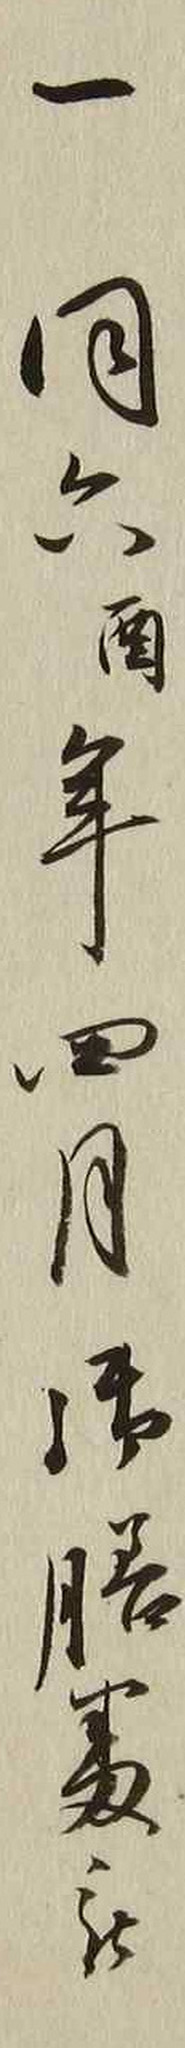一同六酉年四月御膳番被
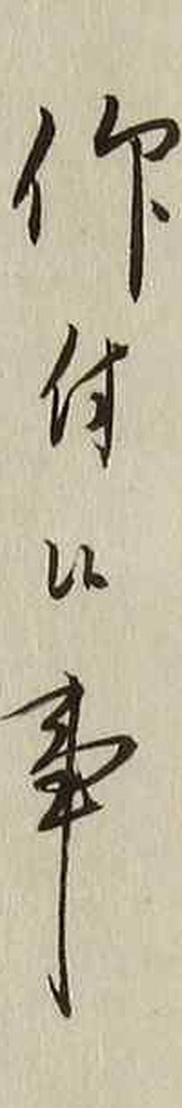仰付候事
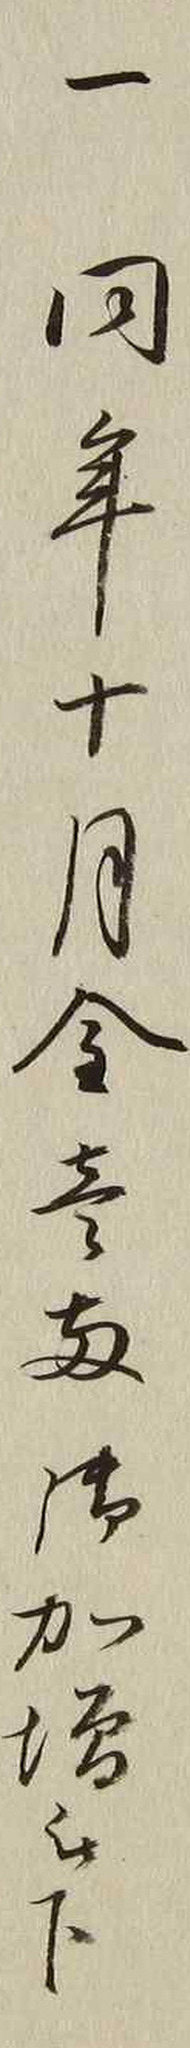一同年十月金壱両御加増被下
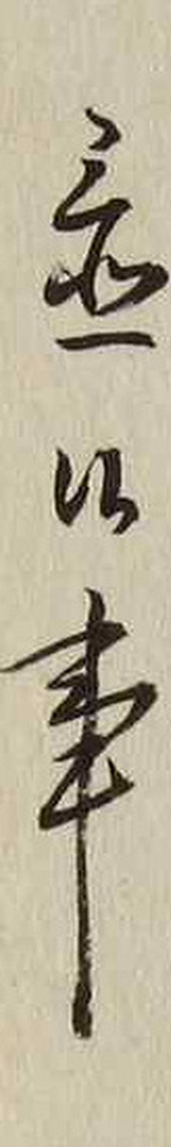置候事
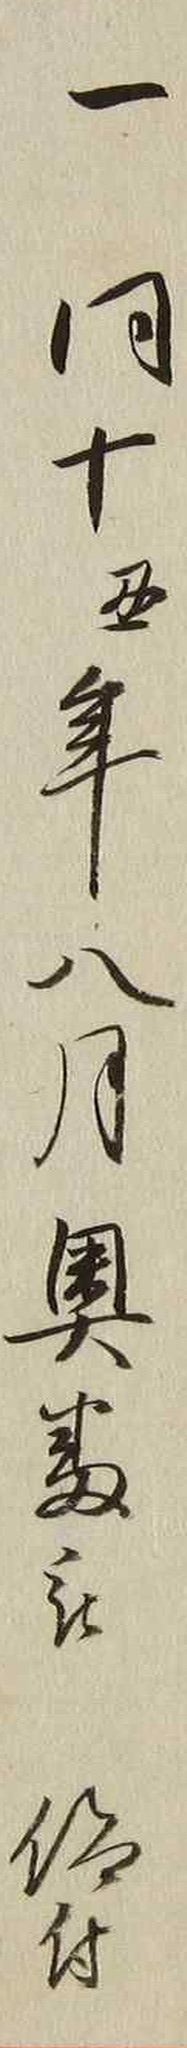一同十丑年八月奥番被仰付
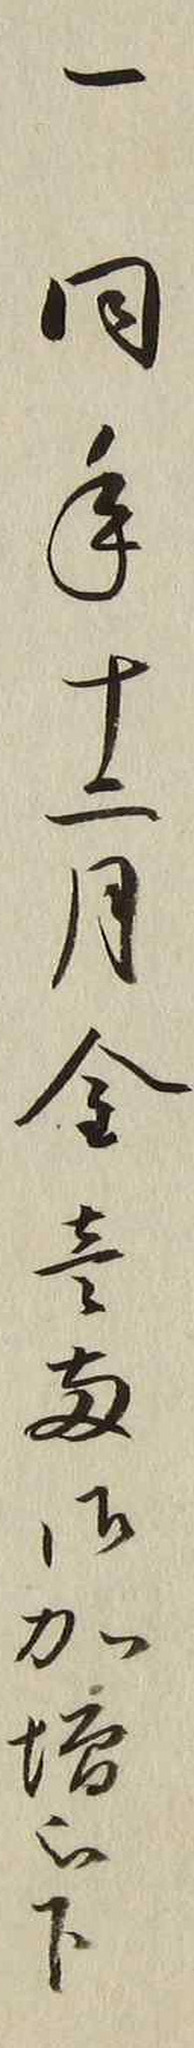一同年十二月金壱両御加増被下
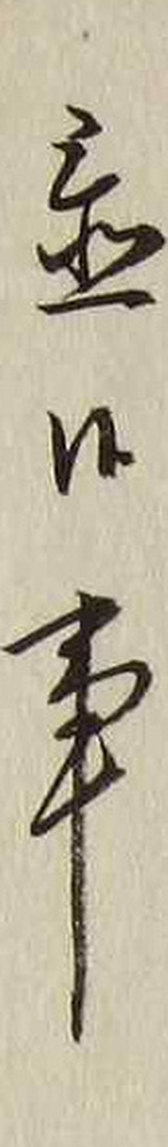置候事
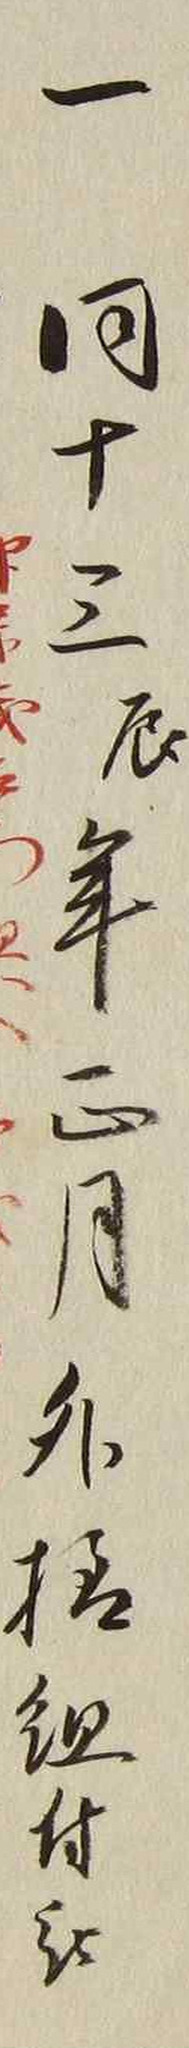一同十三辰年正月外様組付被
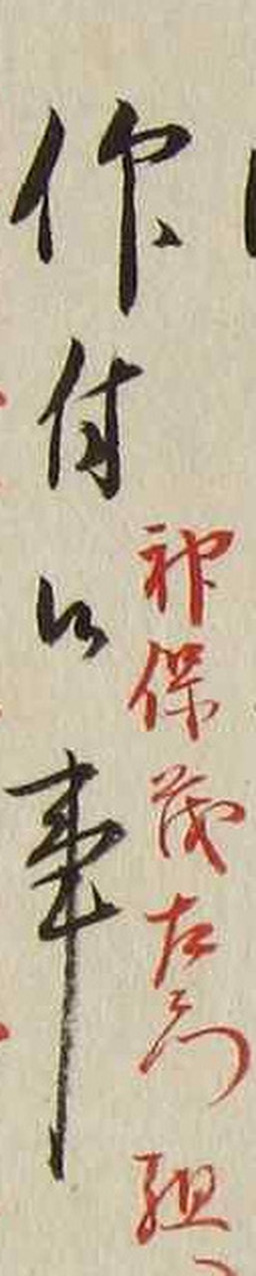仰付候事
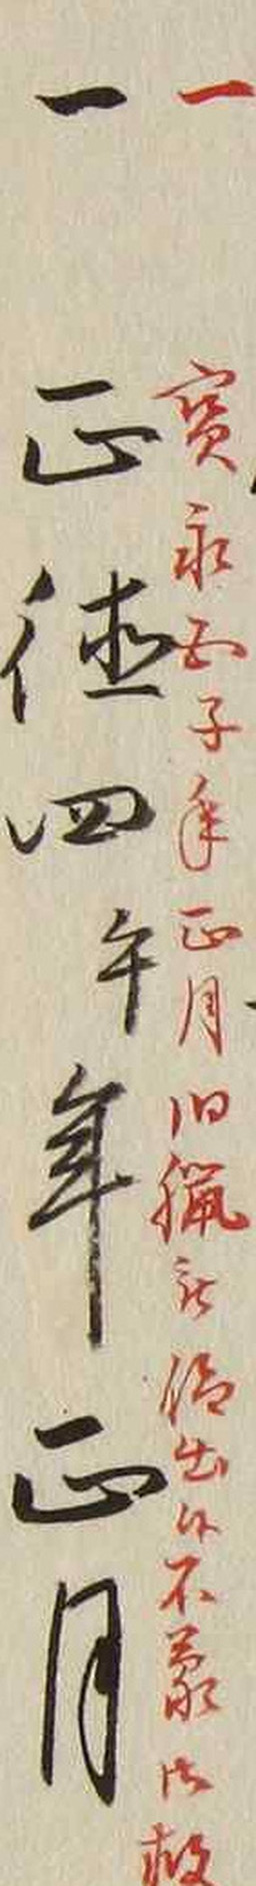一正徳四午年正月

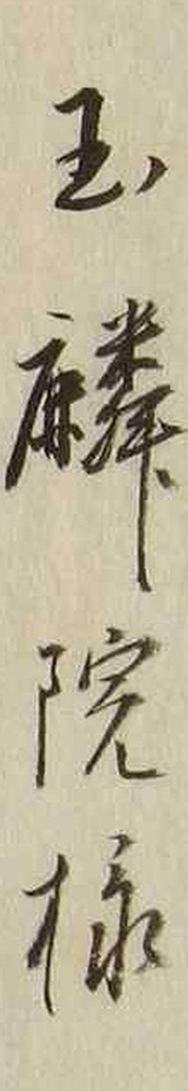玉麟院様
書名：諸士系譜　巻之22　い之部22
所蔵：会津若松市立会津図書館
